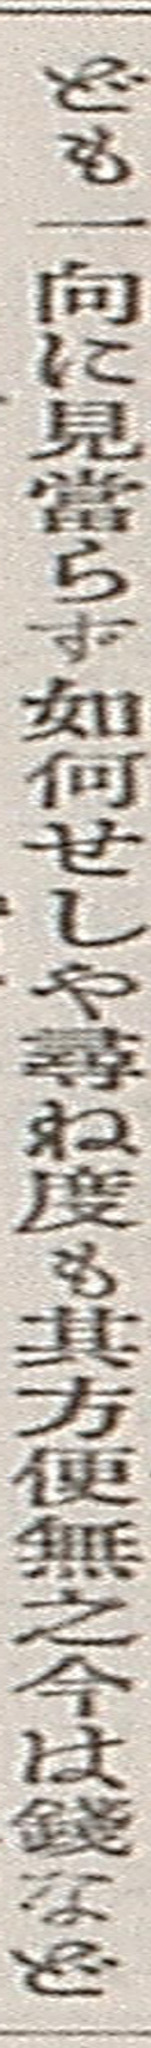ども一向に見当らず如何せしや尋ね度も其方便無之今は銭など
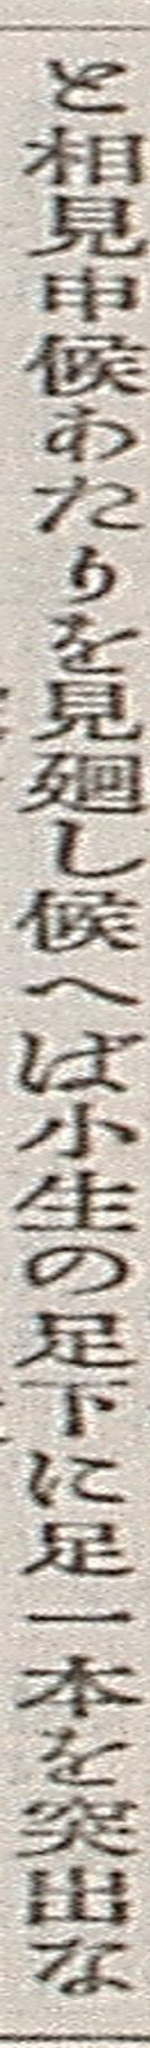と相見申候あたりを見廻し候へば小生の足下に足一本を突出な
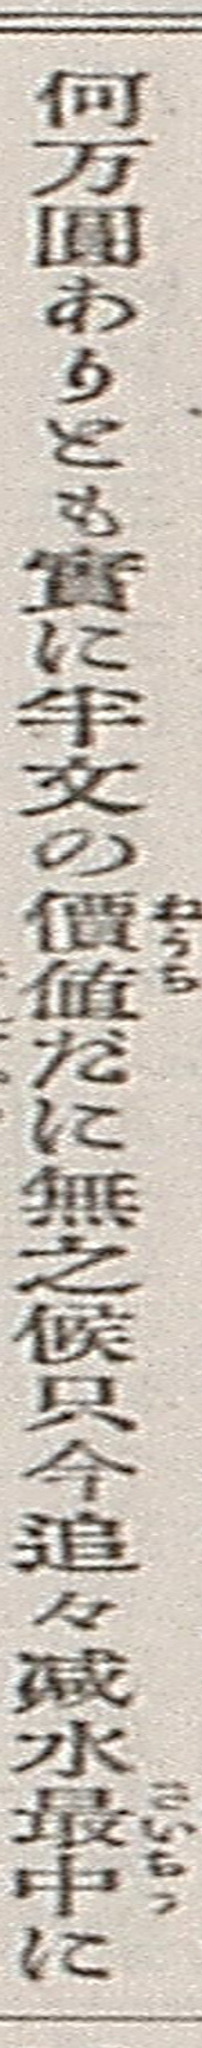何万円ありとも実に半文の価値だに無之候只今追々減水最中に
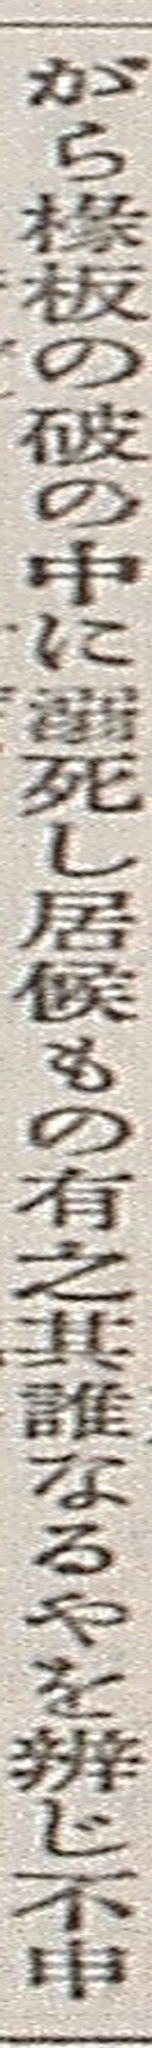がら椽板の破の中に溺死し居候もの有之其誰なるやを弁じ不申
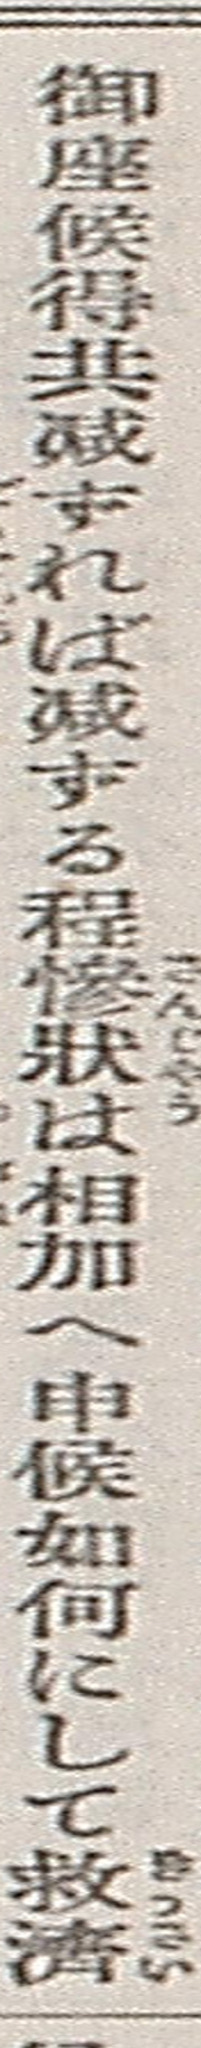御座候得共減ずれば減ずる程惨状は相加へ申候如何にして救済
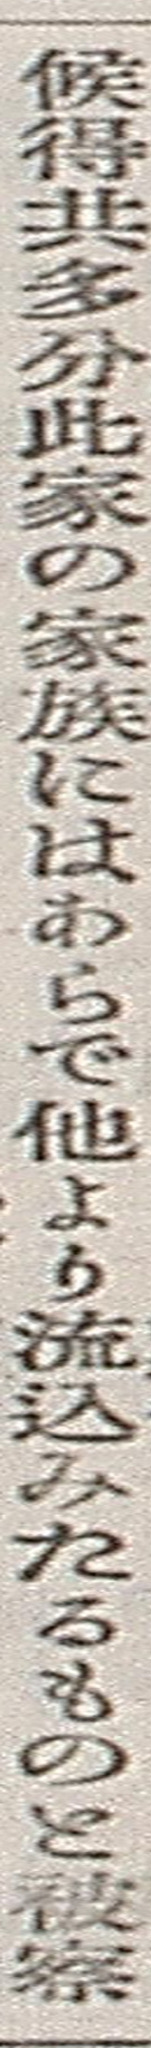候得共多分此の家の家族にはあらで他より流込みたるものと被察
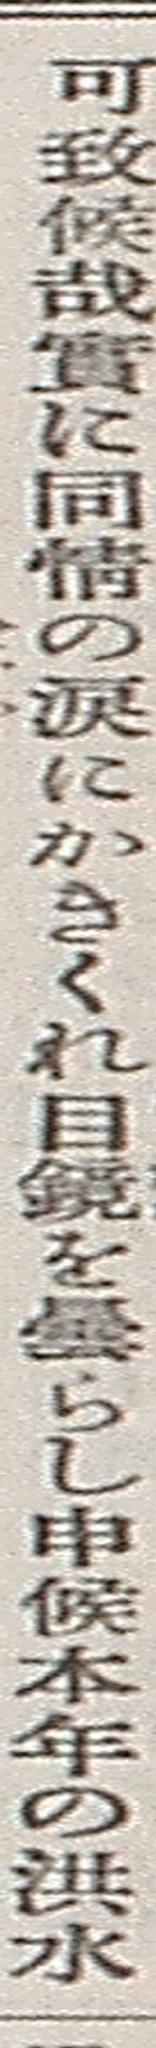可致候哉実に同情のの涙にかきくれ眼鏡を雲らし申候本年の洪水
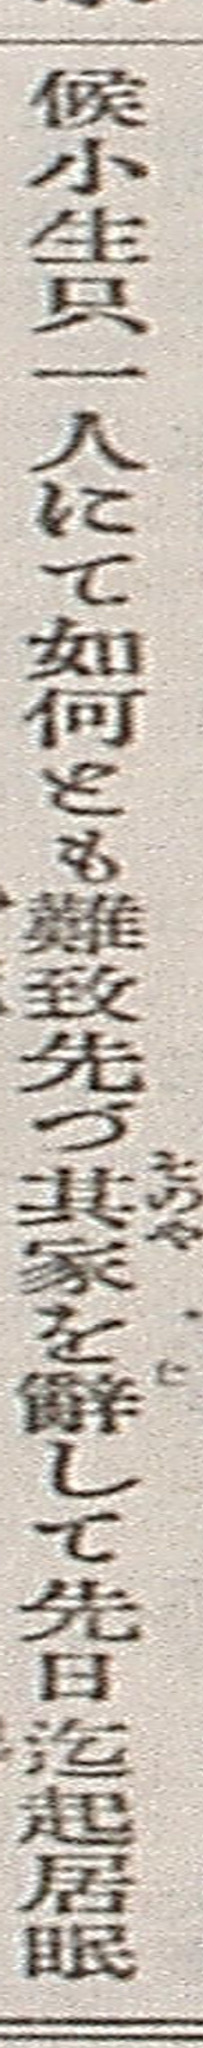候小生只一人にて如何とも難致先づ其家を辞して先日迄起居眠
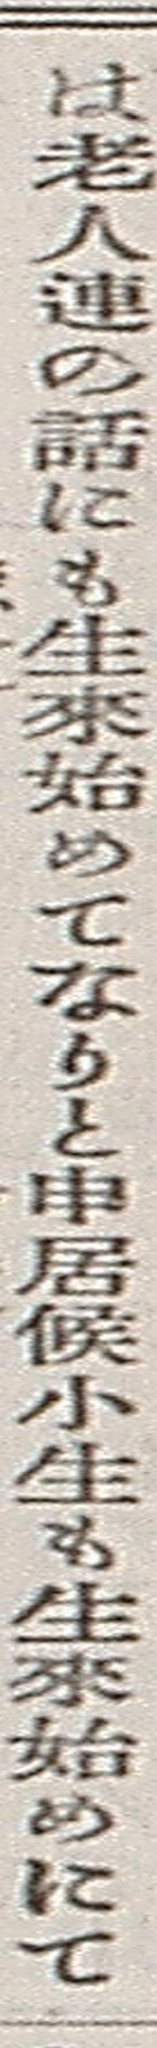破老人連の話にも生来始めてなりと申居候小生も生来始めにて
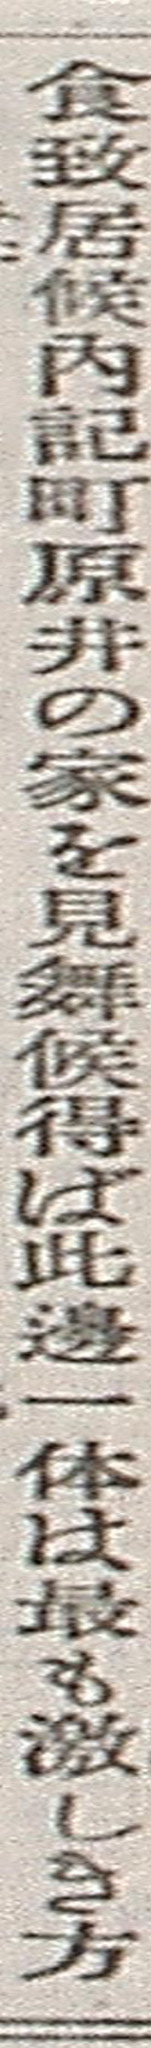食致居候内記町原井の家を見舞候得ば此辺一体は最も激しき方
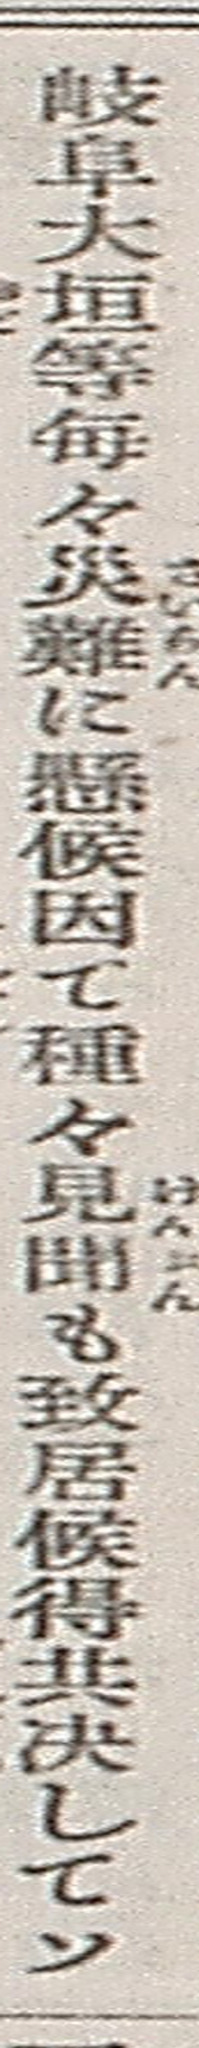岐阜大垣等毎々災難に懸候因て種々見聞も致居候得共决してソ
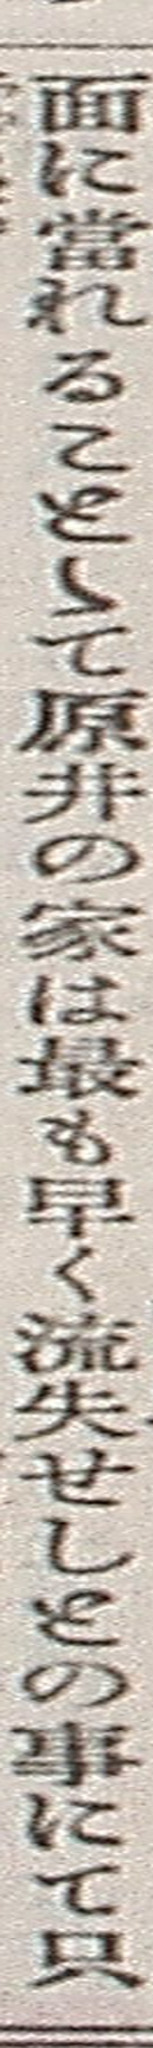面に当れることゝて原井に家は最も早く流失せしとの事にて只
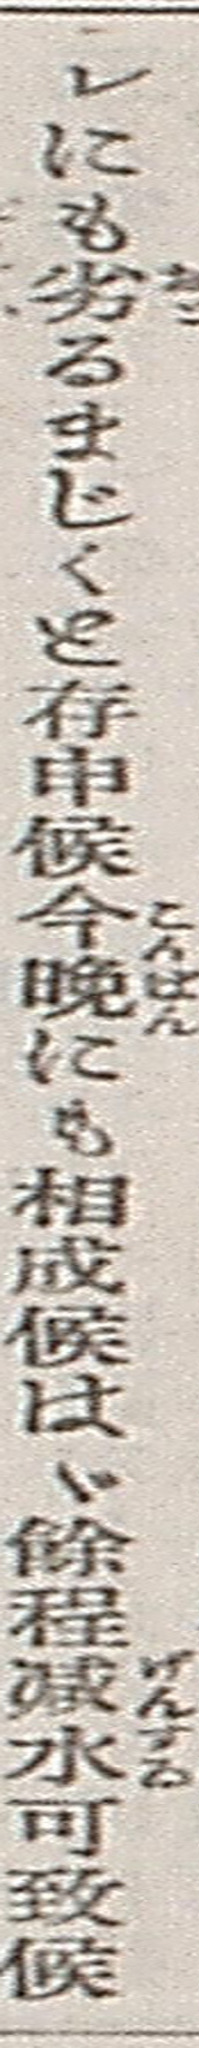レにも劣るまじくと存申候今晩にも相成候はゞ餘程減水か致候
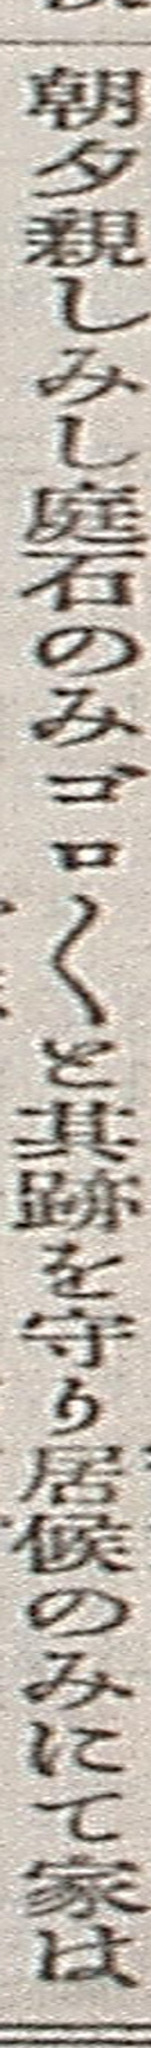朝夕親しみし庭石のみゴロ〳〵と其跡を守り居候のみにて家は
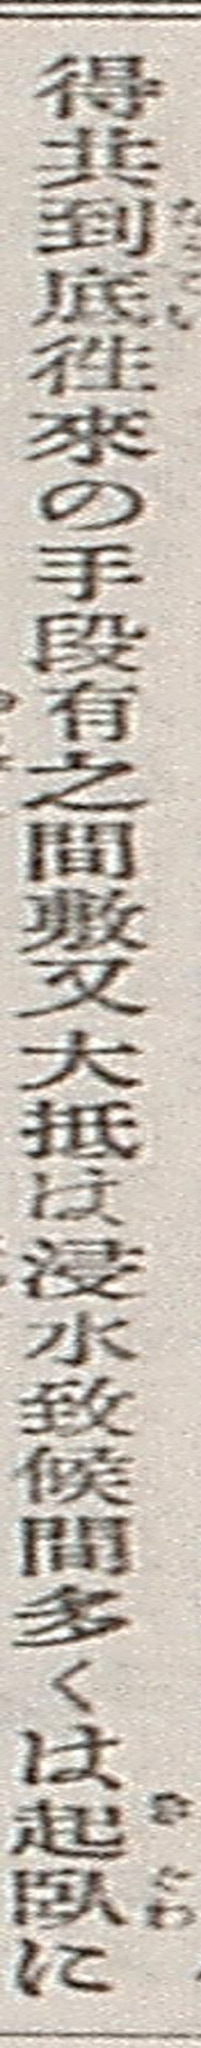得共到底往来の手段有之間敷又大抵は浸水致候間多くは起臥に
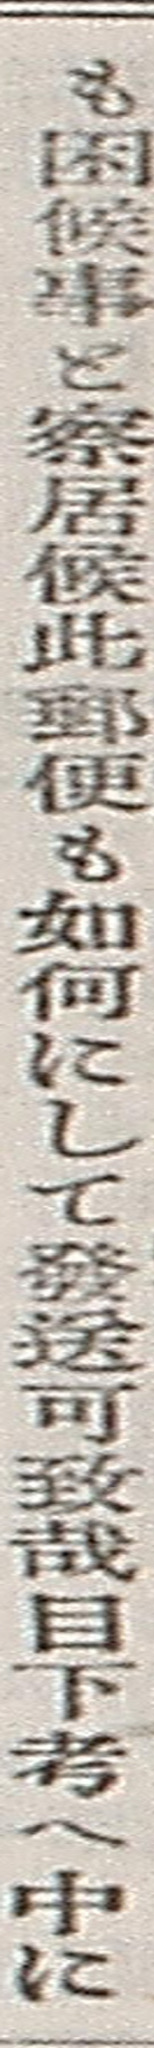も困候事と察し居候此郵便も如何にして発送可致哉目下考へ中に
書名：風俗畫報臨時増刊第百二十六號　洪水被害録（中）
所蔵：東京大学地震研究所図書室 Earthquake Research Institute Library, The University of Tokyo, JAPAN
